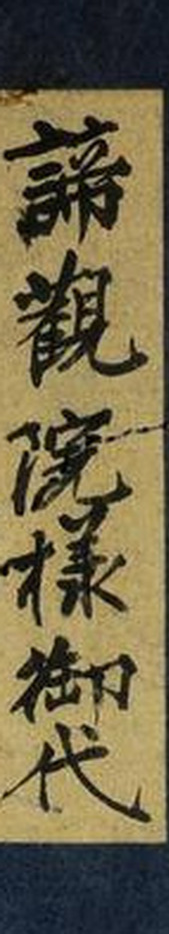諦観院様御代
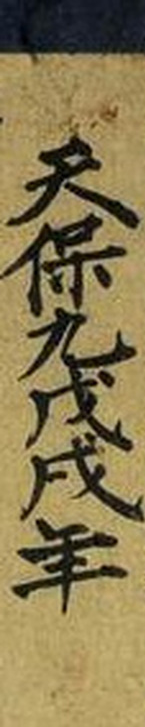天保九戊戌年
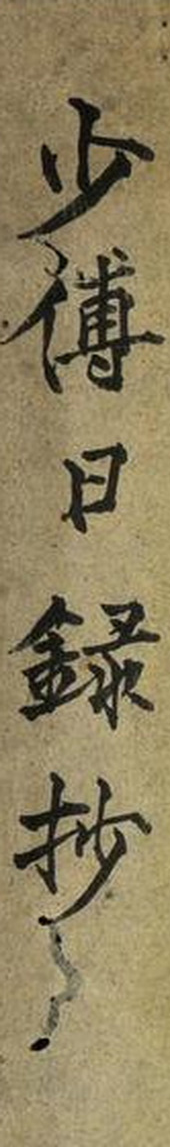少傅日録抄

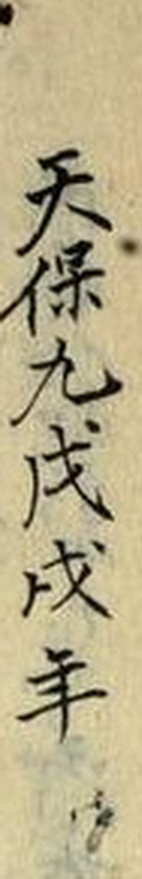天保九戊戌年
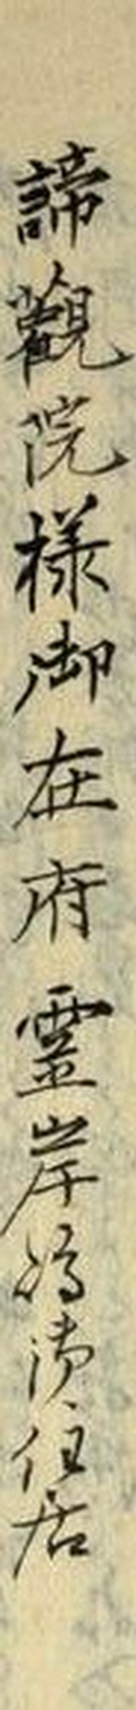諦観院様御在府霊岸島御住居
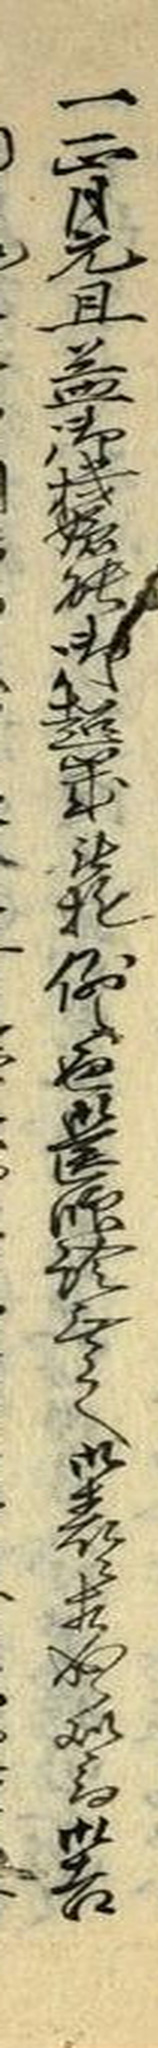一正月元旦益御機嫌能御超歳被遊例之通御医師診無之御表ニ相成候処ニ而御吉
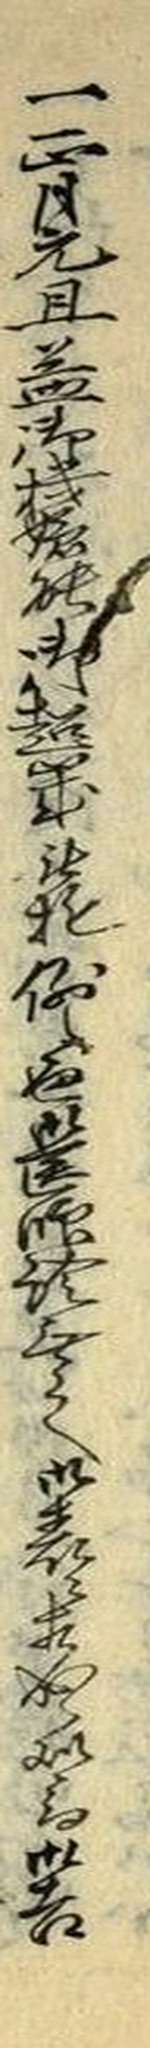一正月元旦益御機嫌能御超歳被遊例之通御医師診無之御表ニ相成候処ニ而御吉
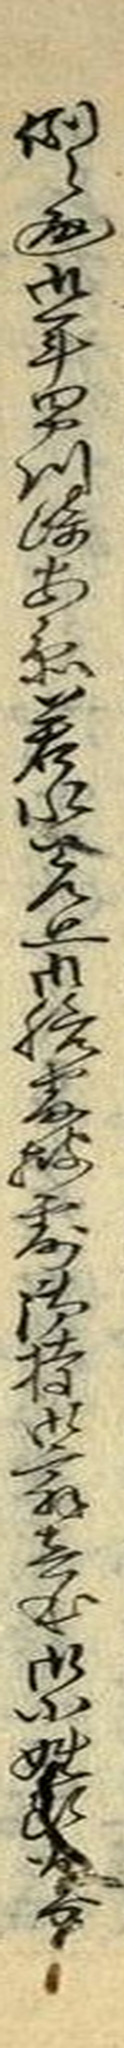例之通御年男川崎安兵衛若水差上御膳番披露御持御扇壱本御小姓頭取ゟ
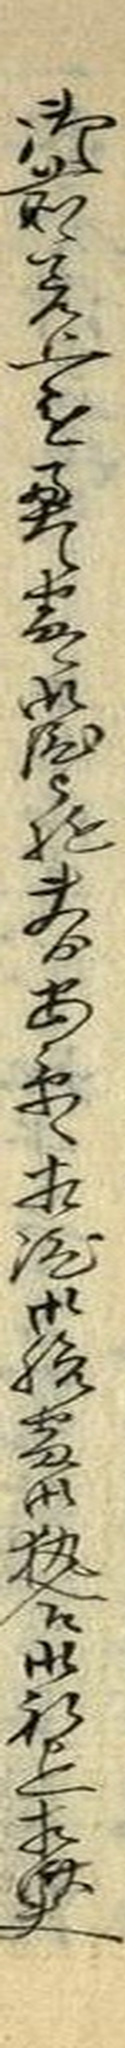御前へ差上を奥之番へ御渡被遊夫ゟ安兵衛へ相渡御膳番御執合御礼申上相済夫
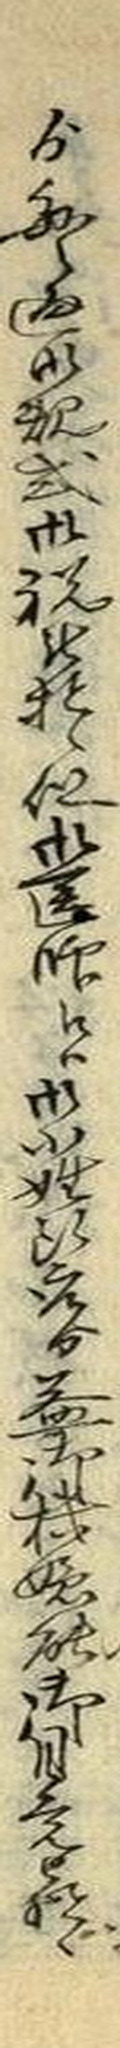ゟ毎々通御規式御祝被遊候但御医師江ハ御小姓頭取ゟ益御機嫌能御目覚被遊候
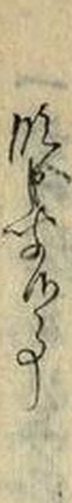段申聞候事
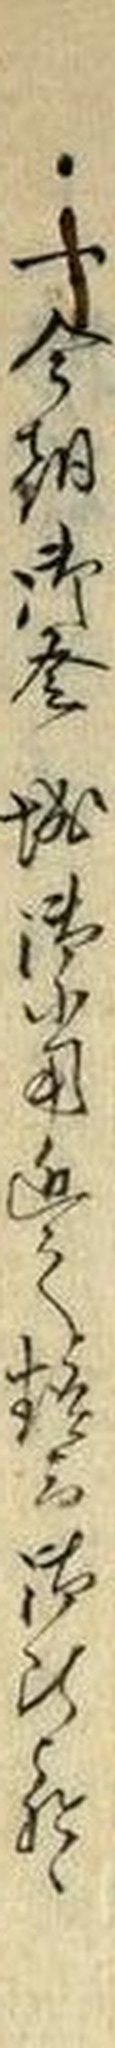一今朝御登城御小用近之趣ニ而御断被遊候
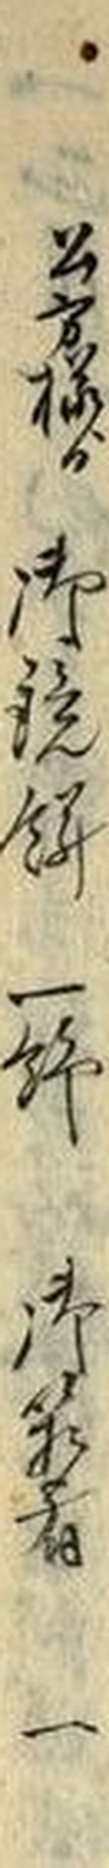公方様ゟ御鏡餅一飾御箱肴一
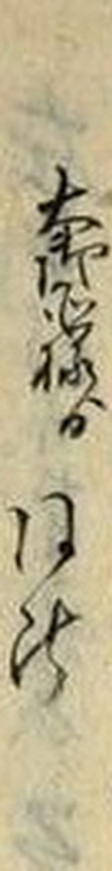大御台様ゟ同断
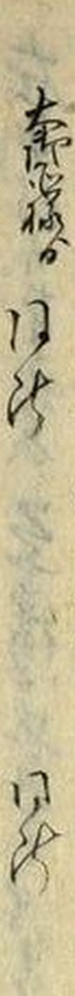大御御所様ゟ同断同断
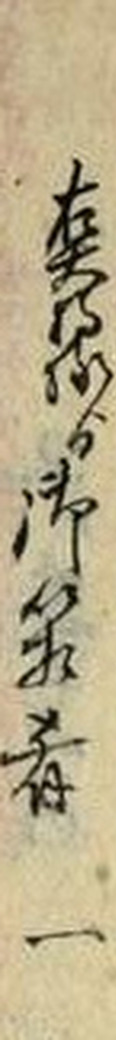右大将様ゟ御箱肴一
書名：少傅日録抄（斉善付側向頭取日記、江戸并道中、初入在国、逝去後…
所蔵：福井県文書館 Fukui Prefectural Archives
